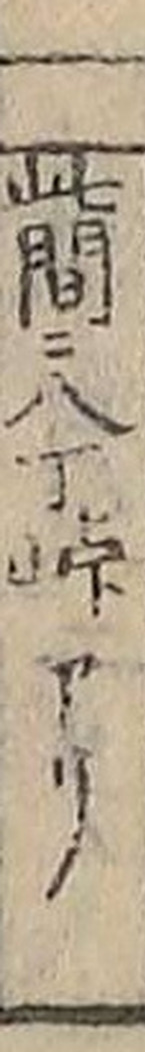此間ニ八丁峠アリ

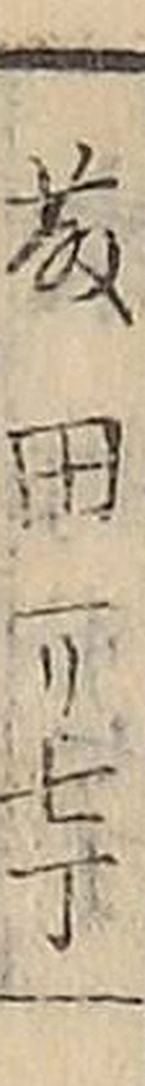藤田一リ七丁
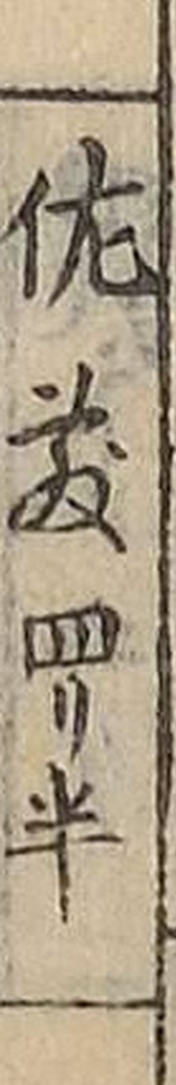佐敷四リ半
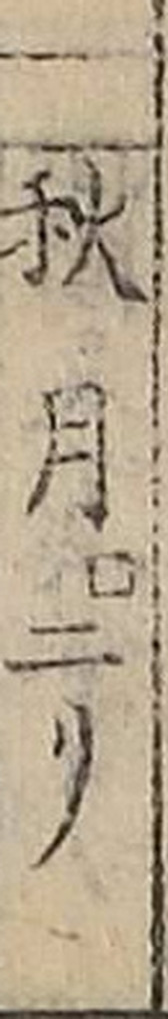秋月▫二リ
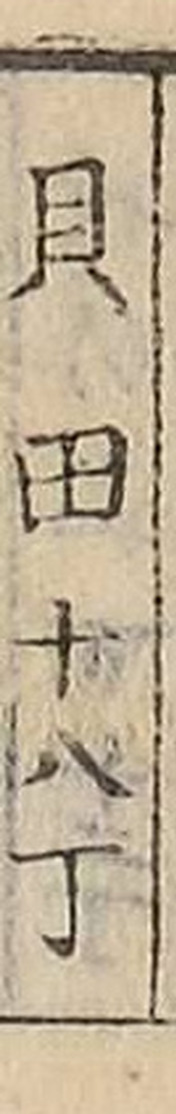貝田十八丁
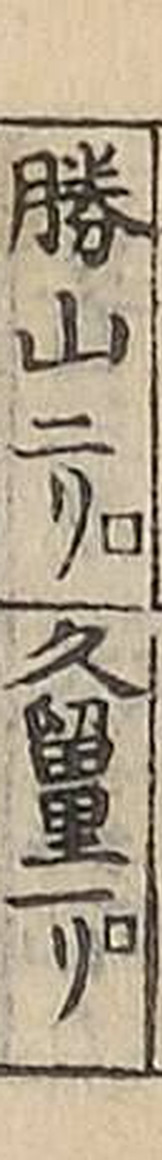勝山二リ久留里一リ
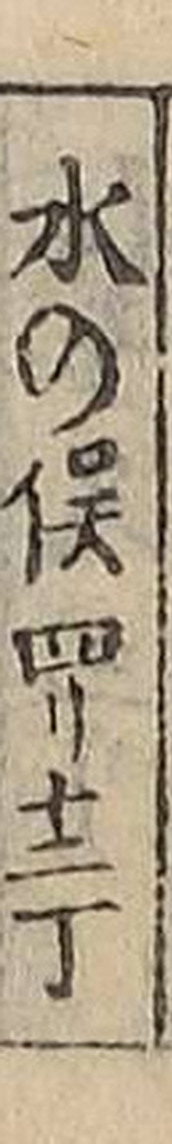水の俣四リ十二丁
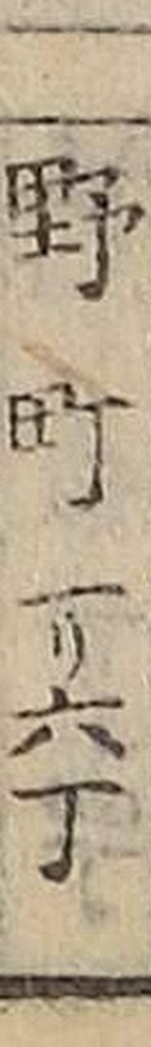野町一リ六丁
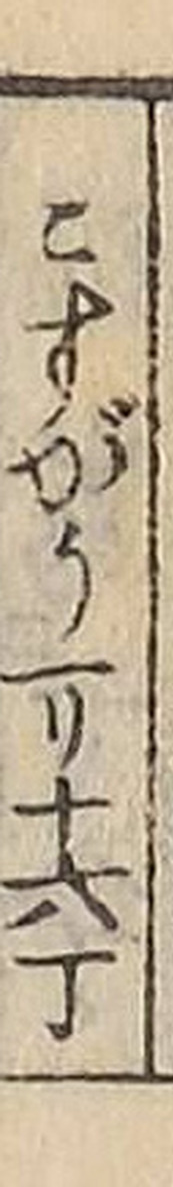こすがう一リ十六丁
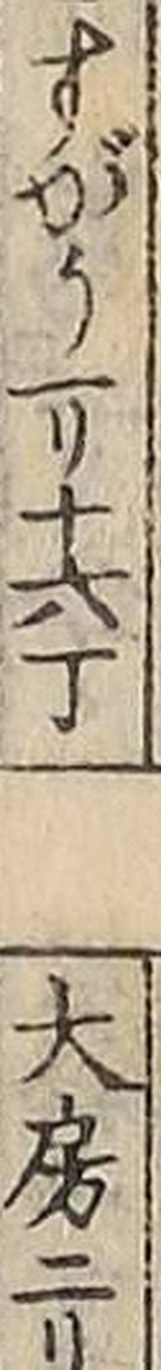こすがう一リ十六丁
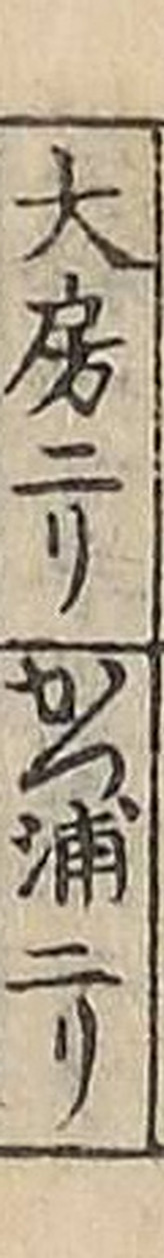大房二リかつ浦二リ
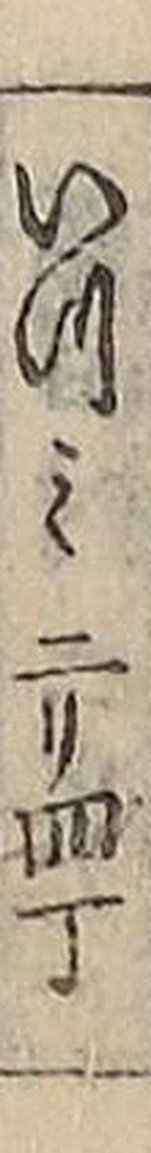いつみ二リ四丁
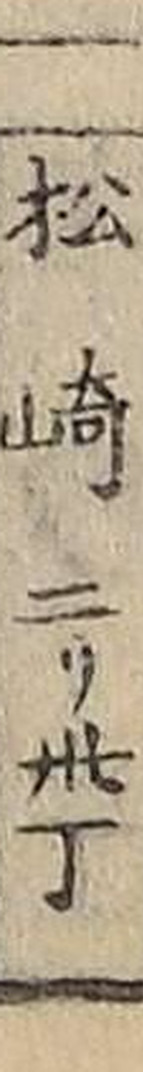松崎二リ卅丁
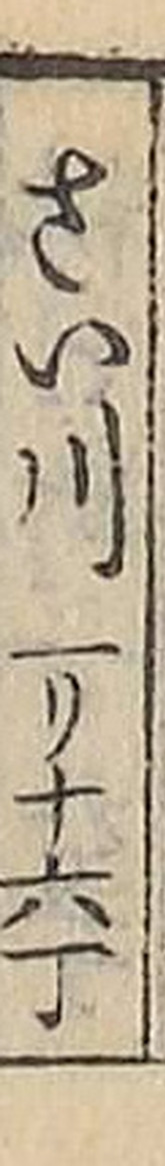さい川一リ十六丁
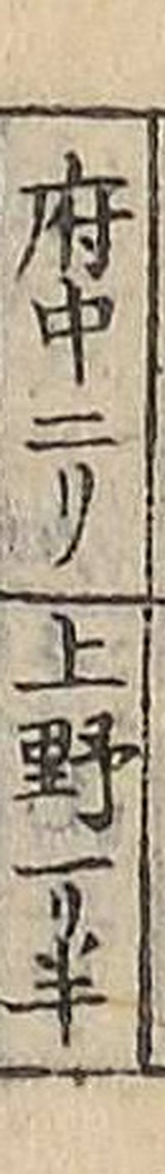府中二リ上野一リ半
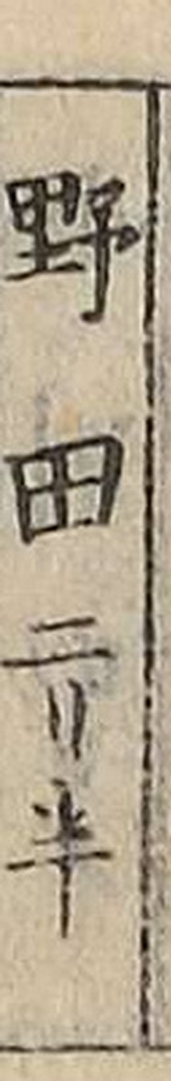野田二リ半
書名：旅行用心集
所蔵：神戸大学附属図書館 国文学研究資料館
